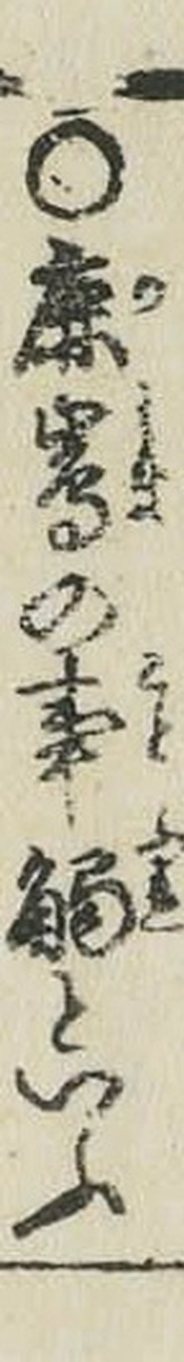○鹿島の事触といふ
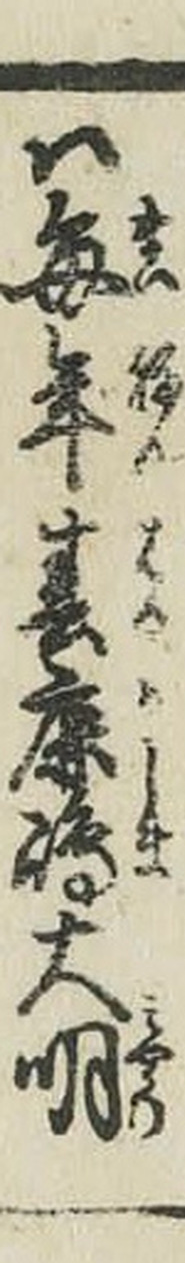は毎年春鹿島大明
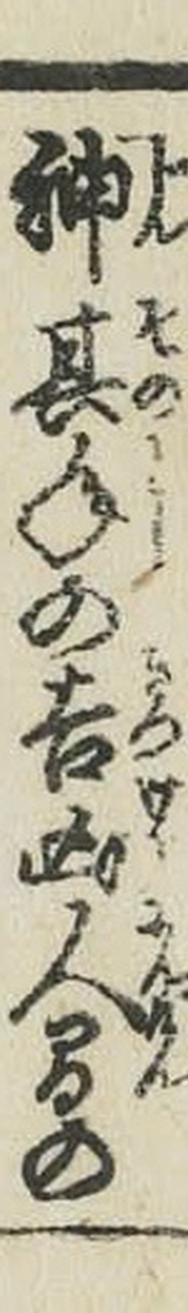神其年の吉凶人間の
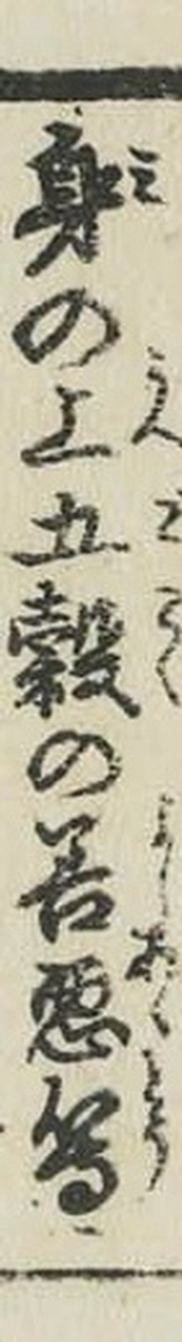身の上五穀の善悪等
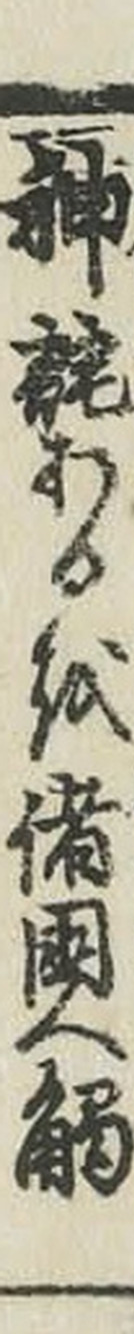神託あるを諸国へ触
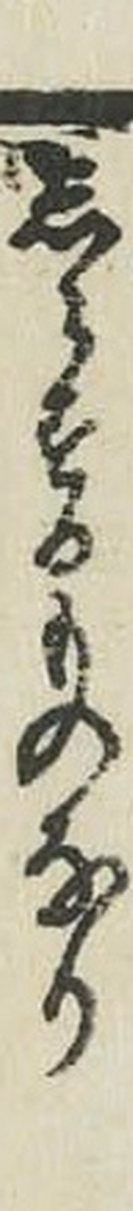しらするものなり
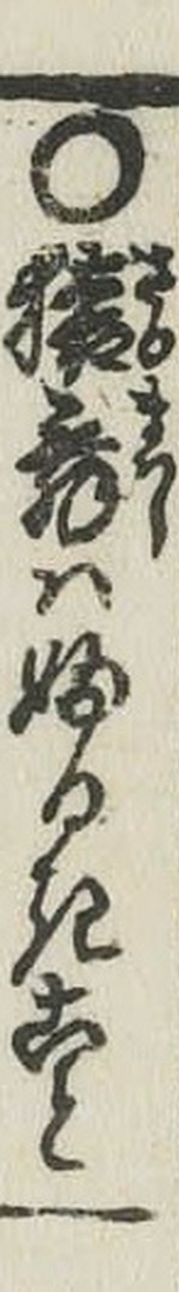○猿舞はふるきこと
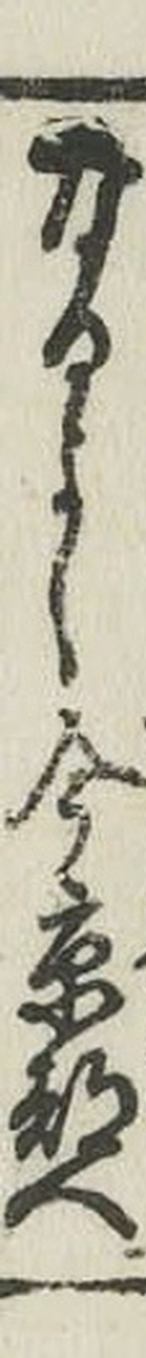なるよし今京都へ
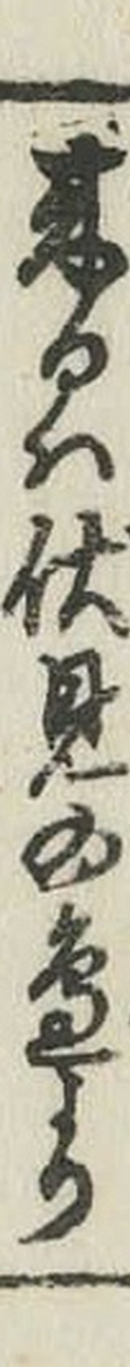来るは伏見の辺より
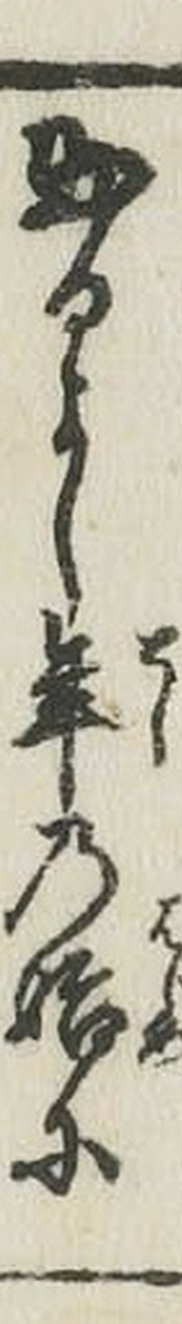出るよし年の始に
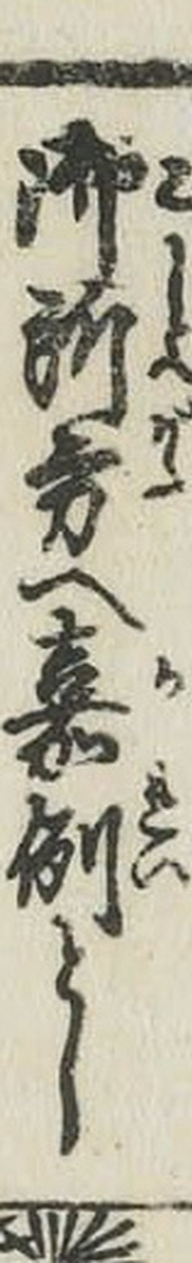御所方へ嘉例とし
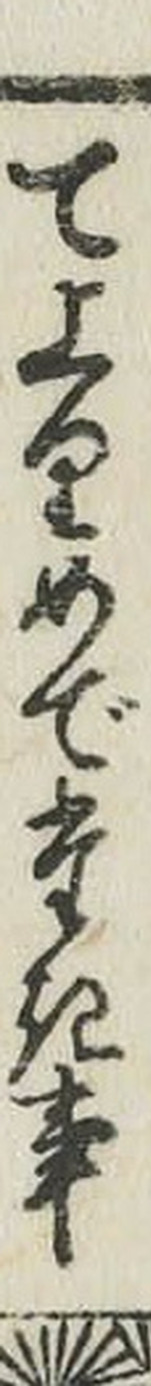て上りめでたき事
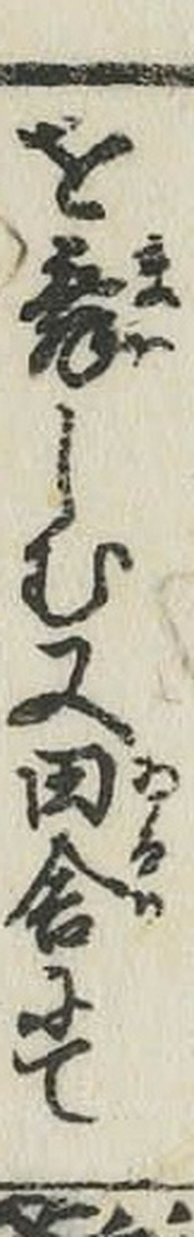を舞しむ又田舎にて
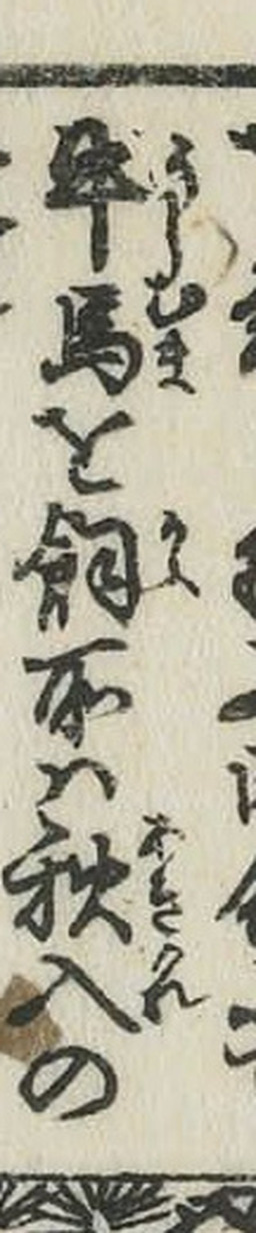牛馬を飼所は秋入の
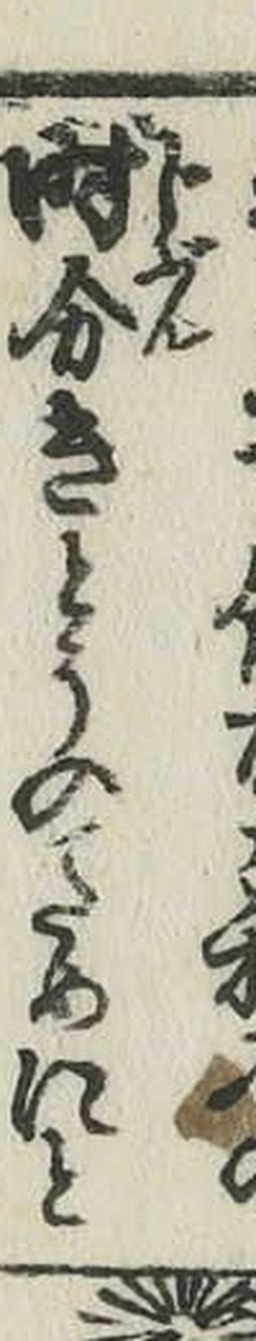時分きとうのためにと
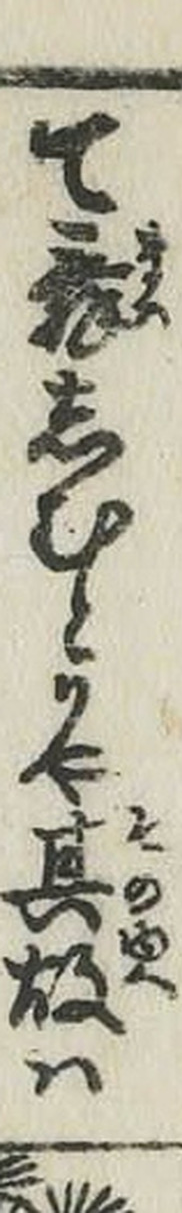て舞しむとかや其故は
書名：増補頭書訓蒙図彙大成 10巻 10:巻之21
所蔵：東京学芸大学教育コンテンツアーカイブ
